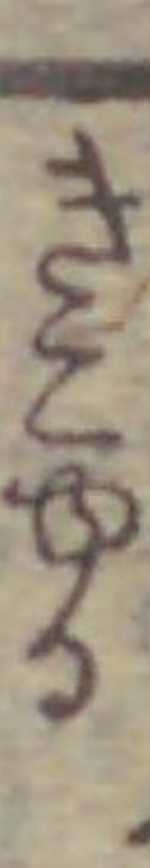ここゆる
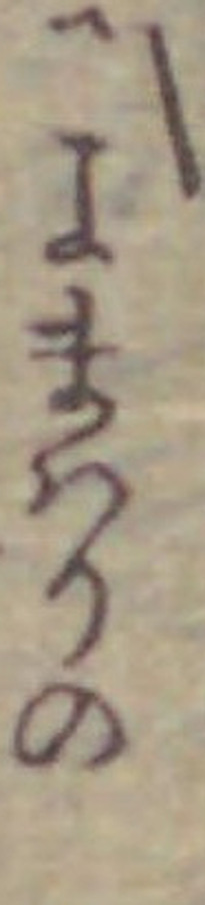〽よまはりの
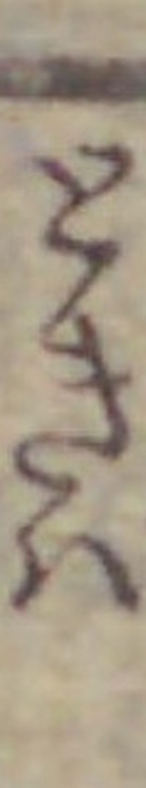ときは
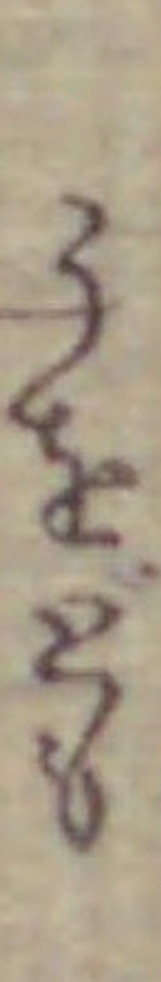うをども
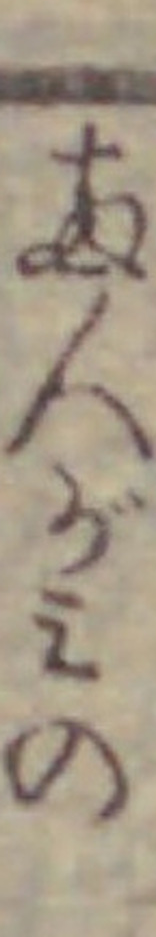両人がみの
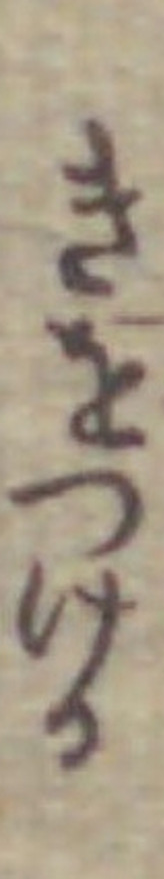きをつける
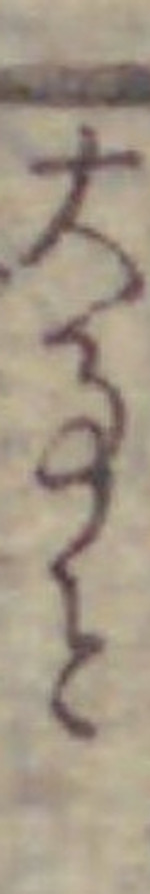大事と
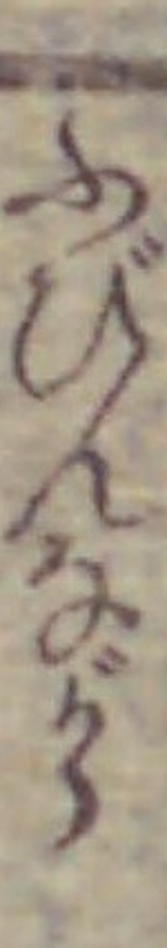ふびんながら
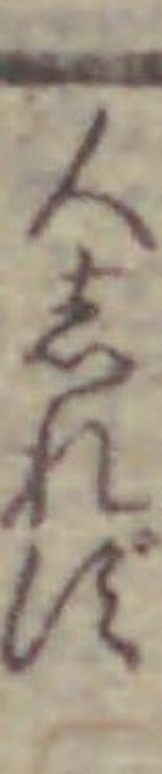人しれず
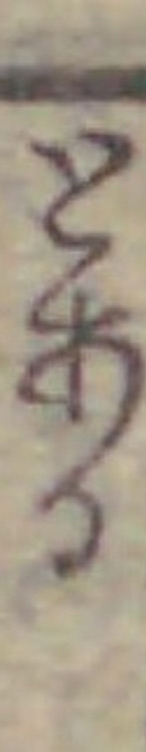とある
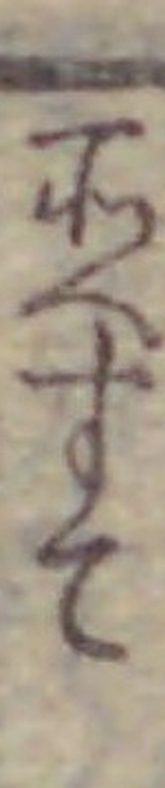所へすて
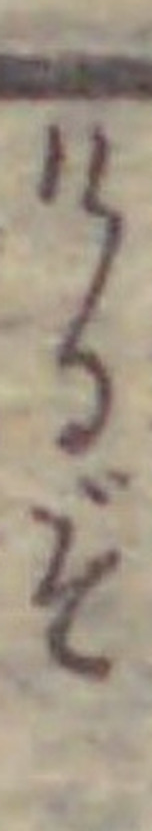けるぞ
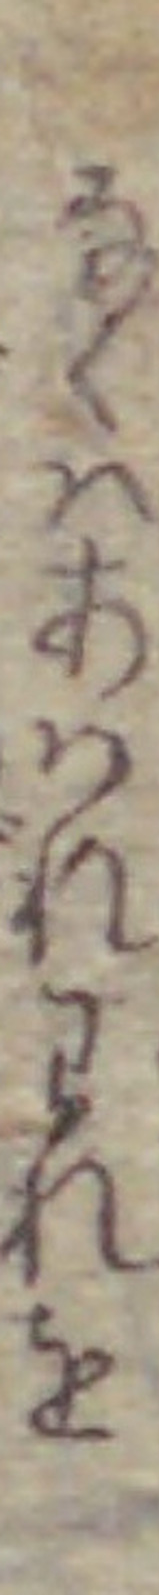なくはあはれわれを
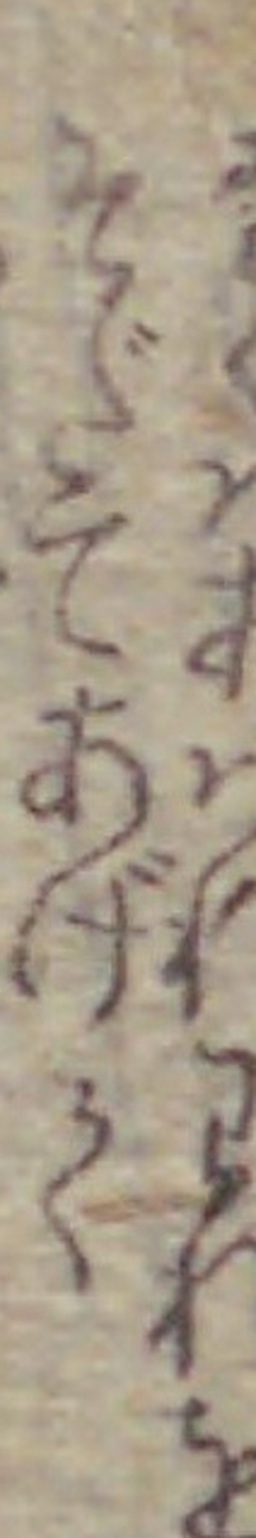そだてあげて
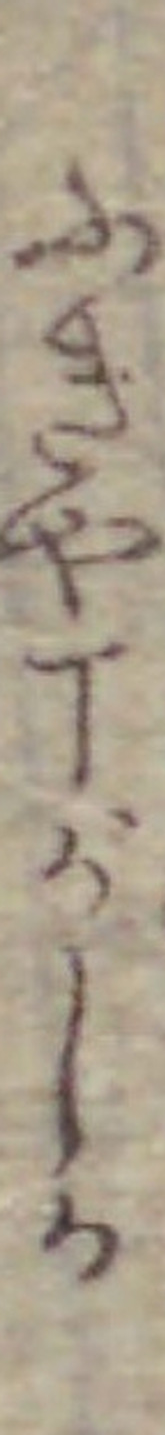ふきや丁がしか
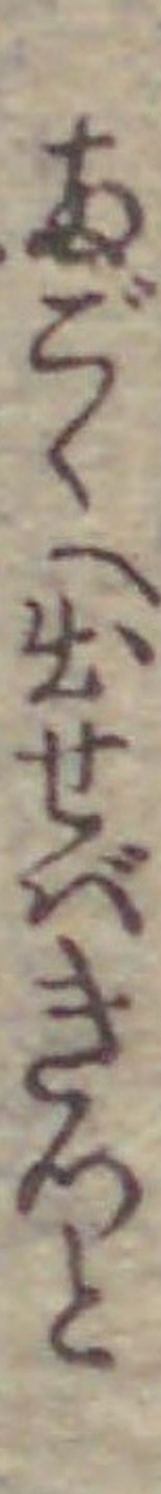両ごくへ出せばきつと
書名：箱入娘面屋人魚 3巻
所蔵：国立国会図書館 National Diet Library, JAPAN
